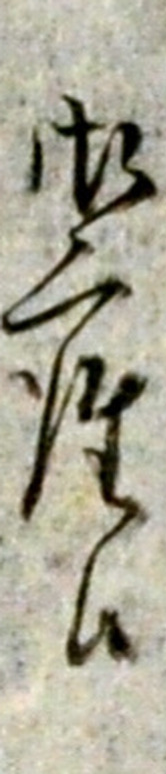御座候
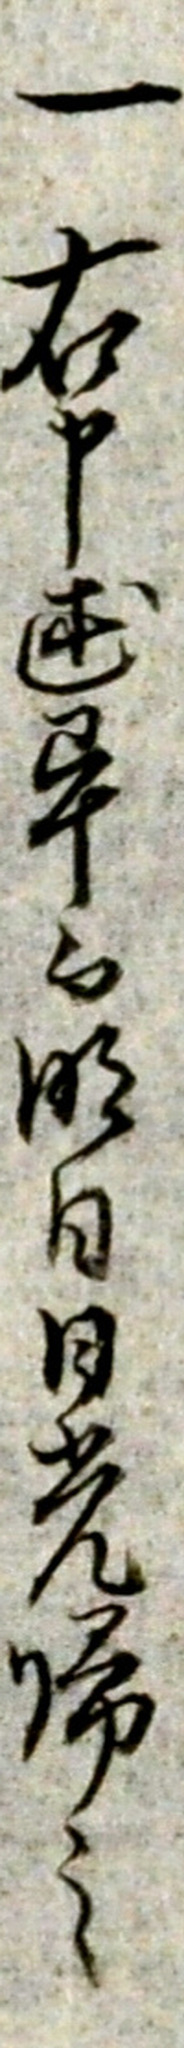一右申述畢而明日日光帰之
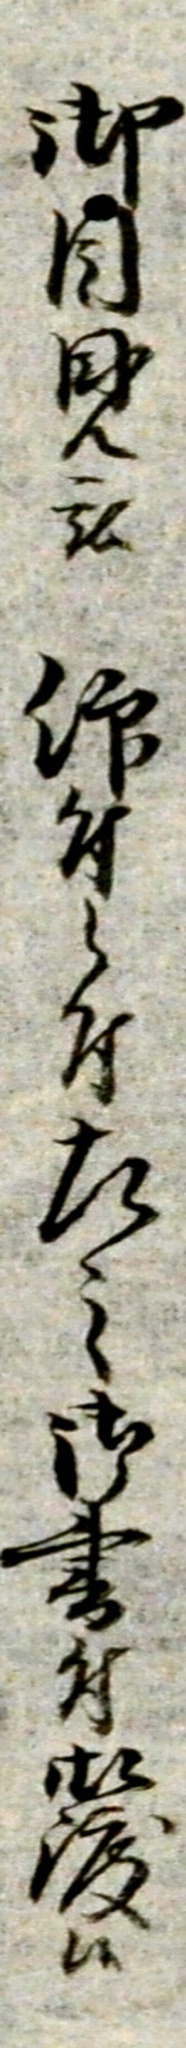御目見被仰付ニ付左之御書付御渡候
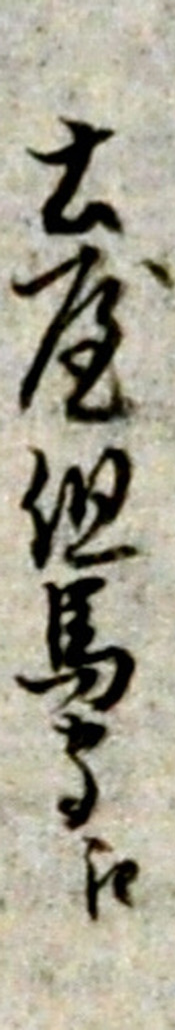土屋但馬守
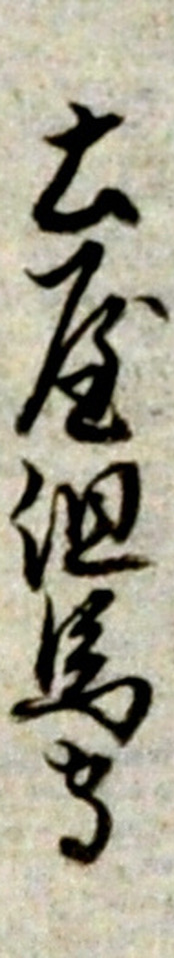土屋但馬守
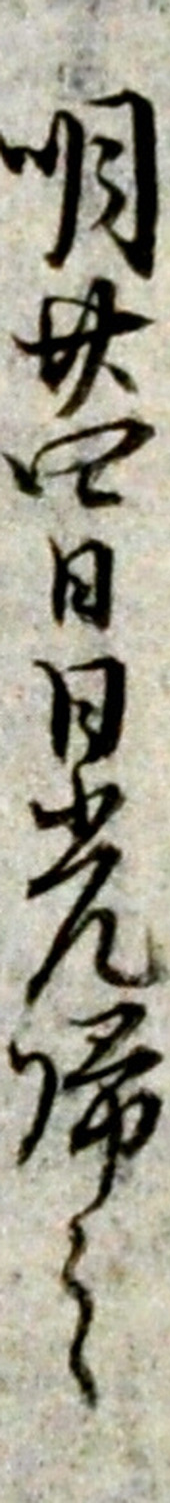明廿四日日光帰之
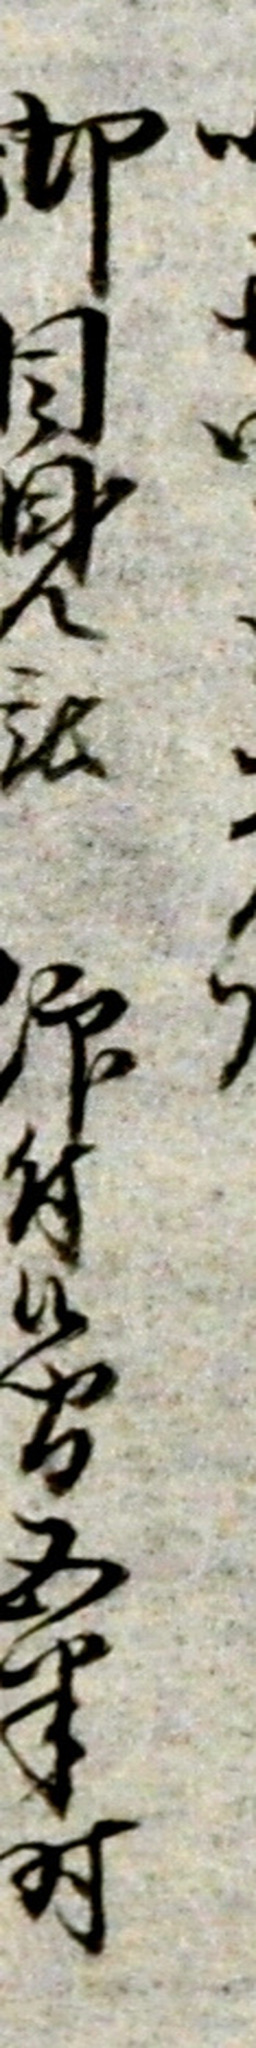御目見被仰付候間五半時

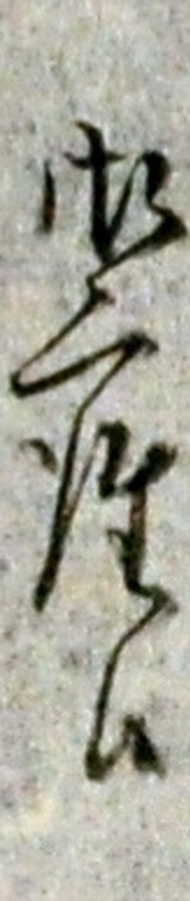御座候
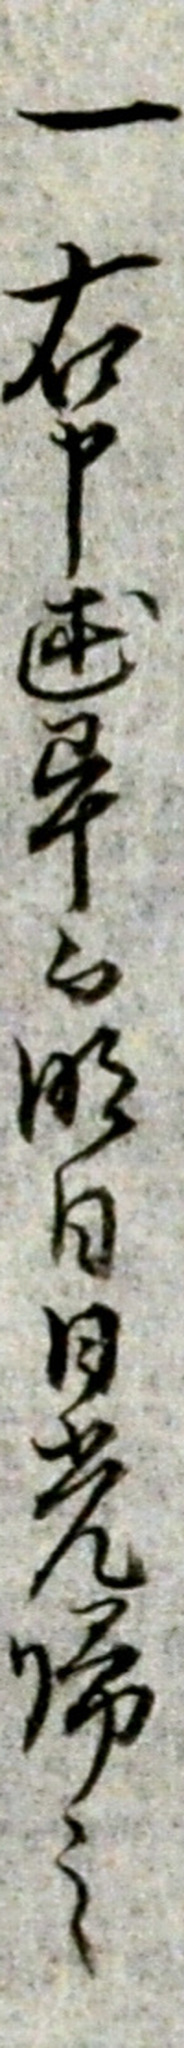一右申述畢而明日日光帰之
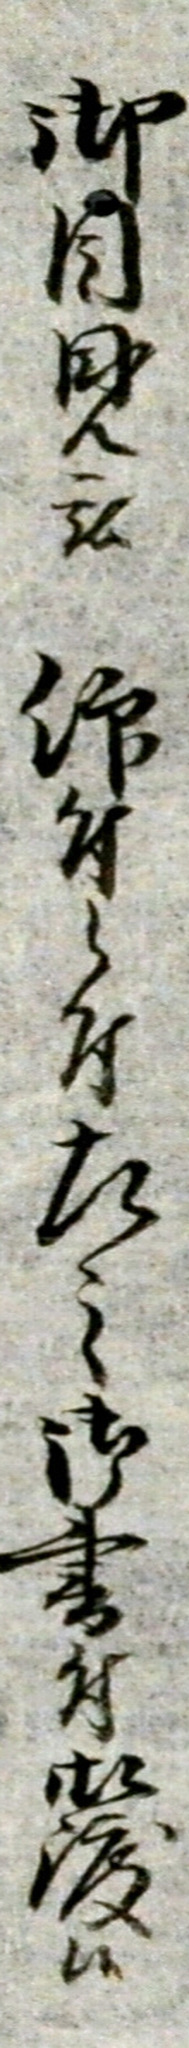御目見被仰付ニ付左之通御書付御渡候
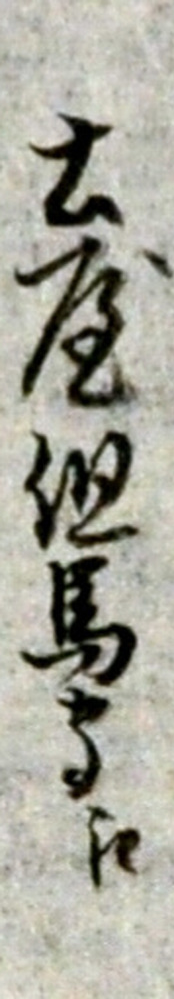土屋但馬守
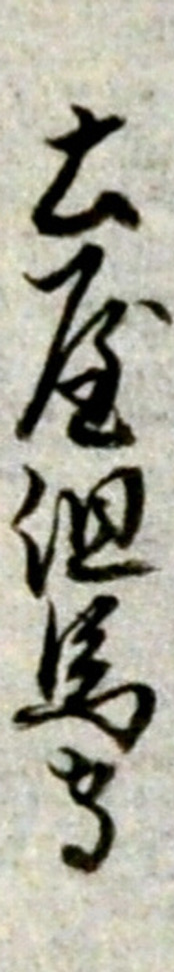土屋但馬守
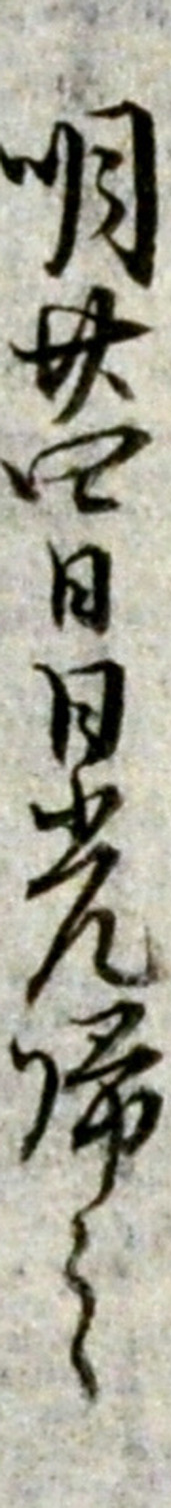明廿四日光帰之
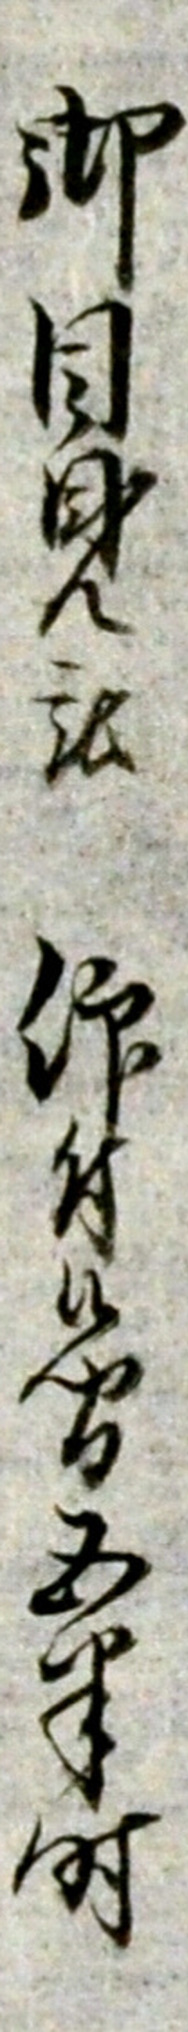御目見被仰付候間五半時
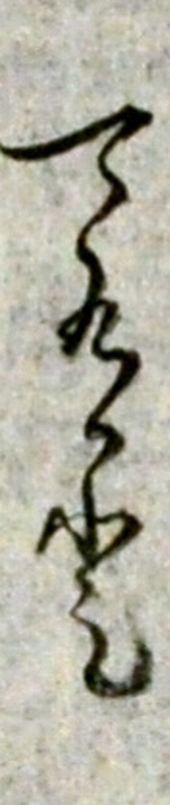可有登
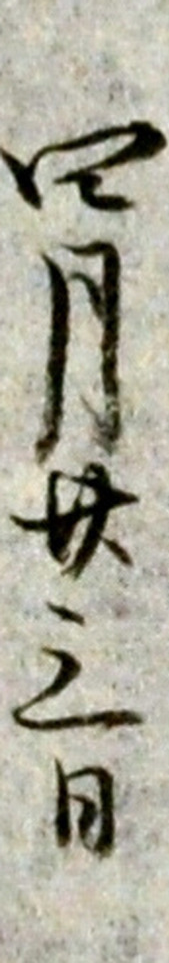四月廿三日
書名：日光御名代相勤候節ノ留
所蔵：伊那市立高遠町図書館・合同会社AMANE
